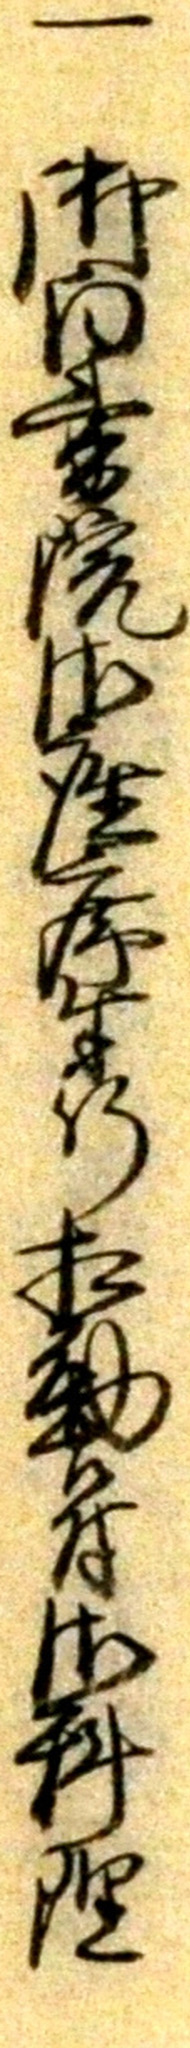一御白書院御座席奉行相勤候付御料理
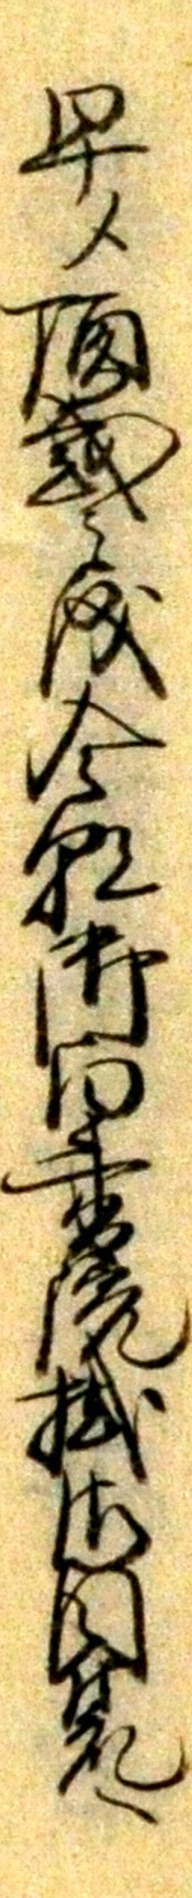早メ頂戴之儀今朝御白書院掛御目付衆へ
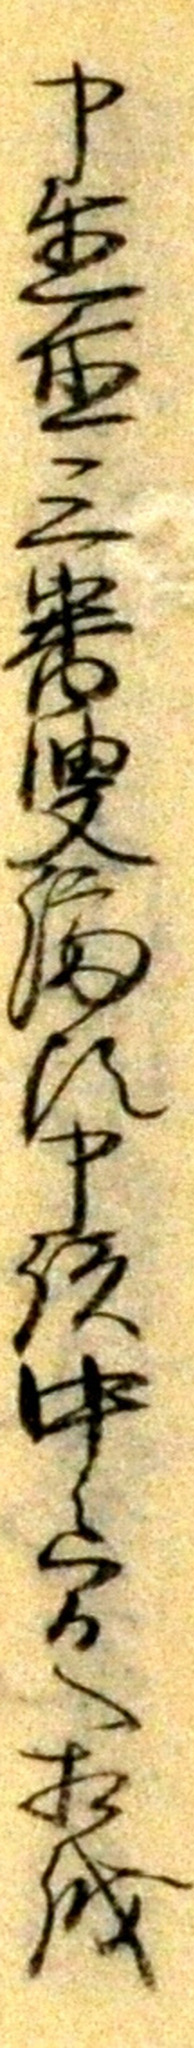申達置三番叟済頃申談中之間へ相越
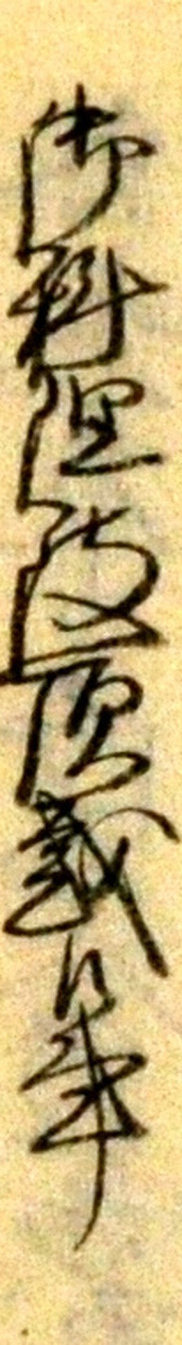御料理致頂戴候事

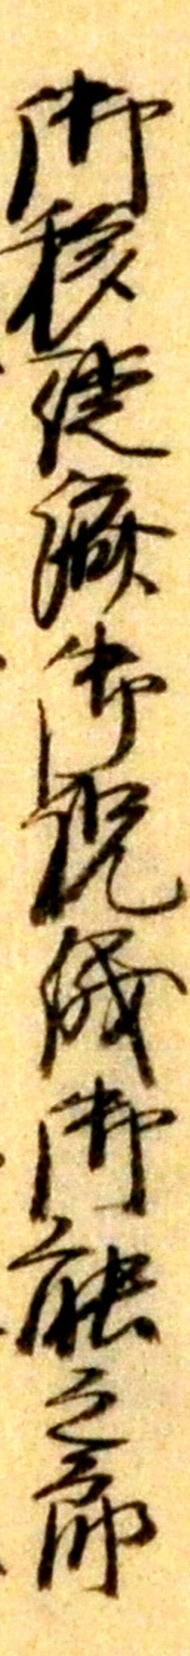御移徙済御祝儀御能之節
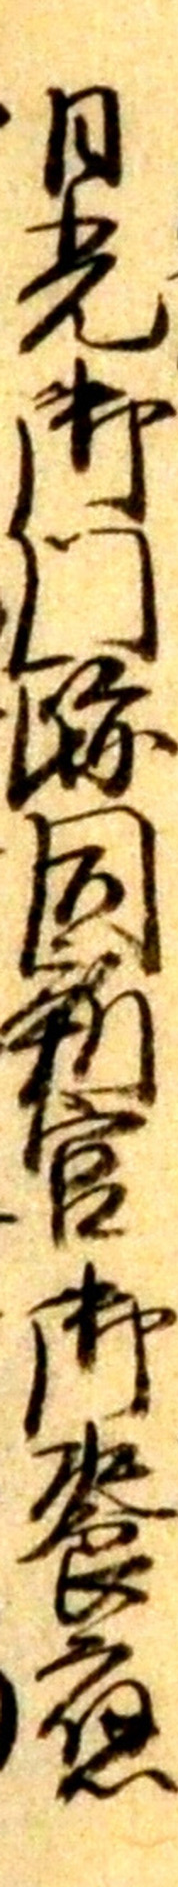日光御門跡同新官御饗応
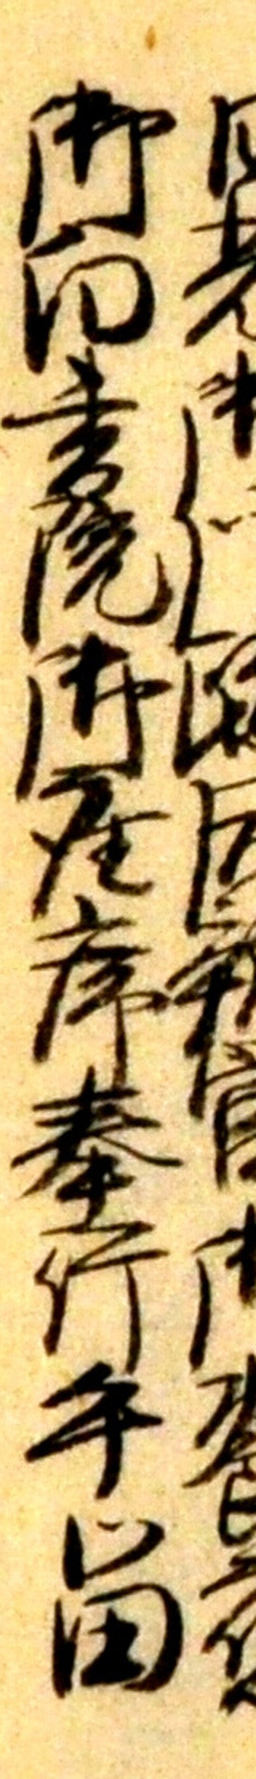御白書院御座席奉行手留
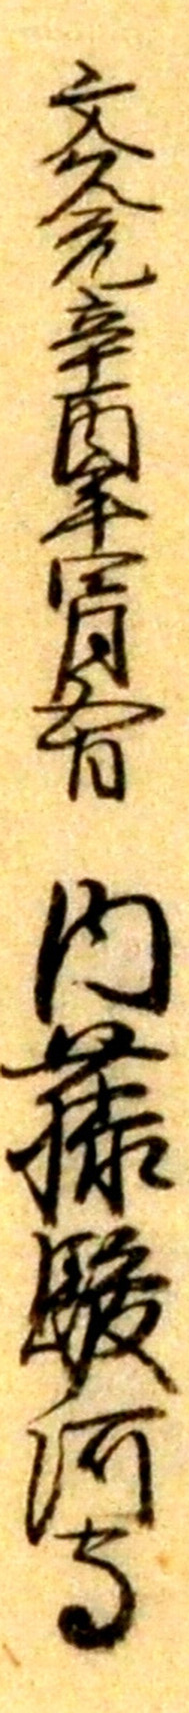文久元辛酉年四月五日内藤駿河守

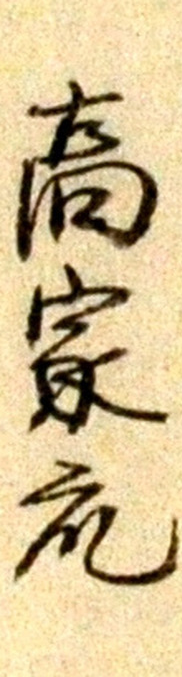高家衆
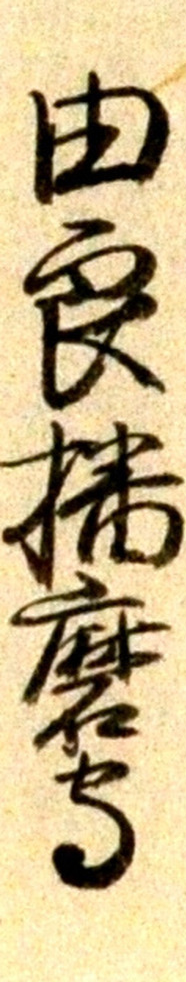由良播磨守
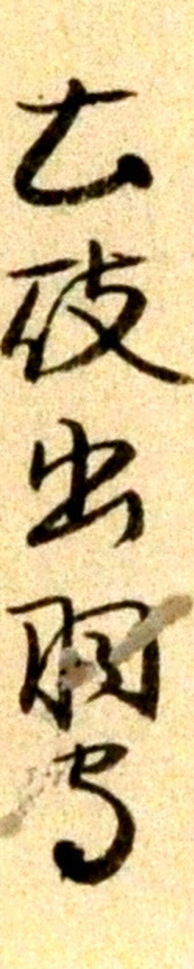土岐出羽守
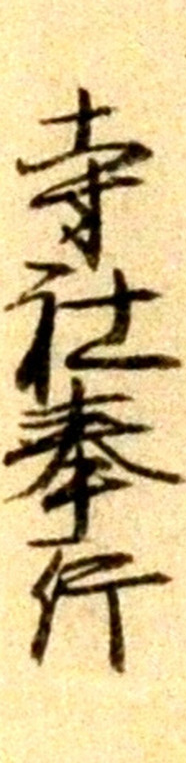寺社奉行
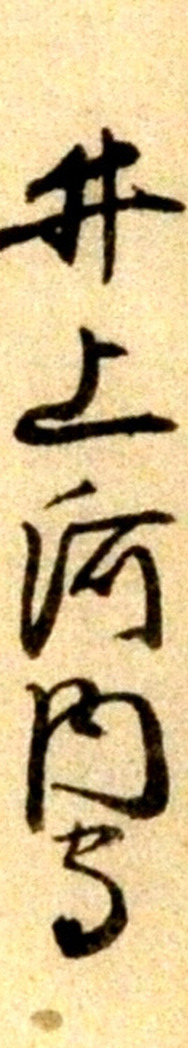井上河内守
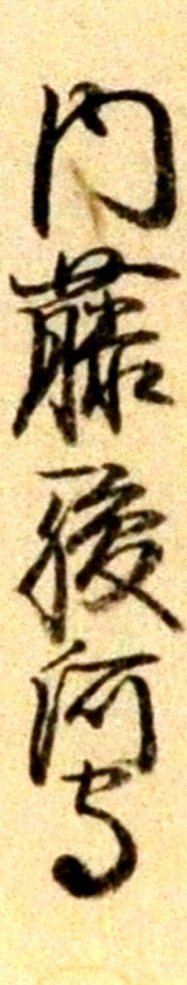内藤駿河守
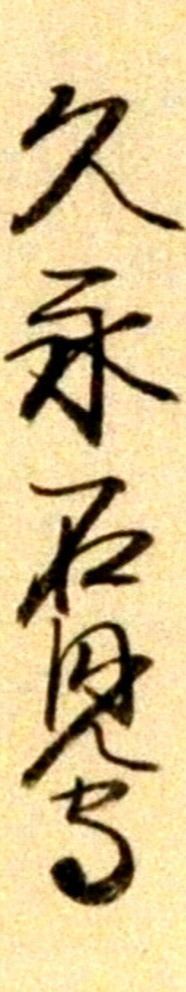久永石見守
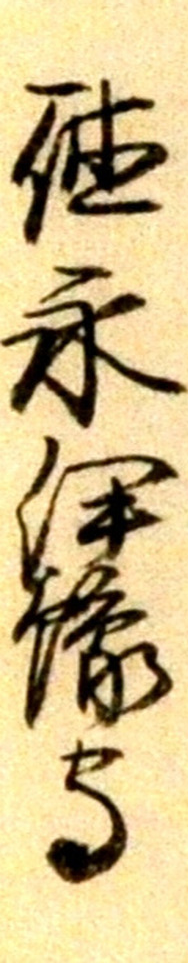徳永伊予守
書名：御移徒相済御祝儀御能ノ節ノ留外
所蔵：伊那市立高遠町図書館・合同会社AMANE
